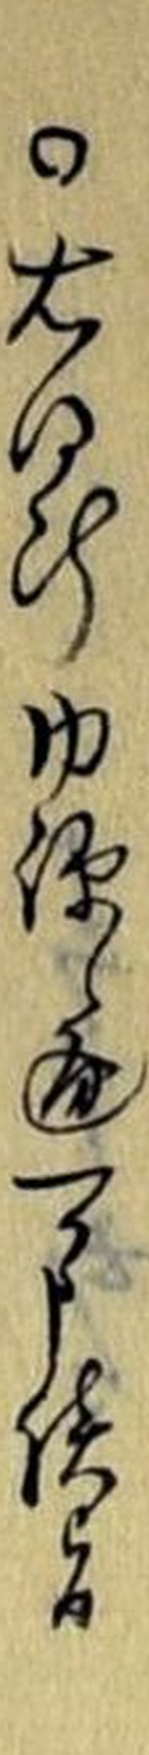○右同断内評之通可申談旨
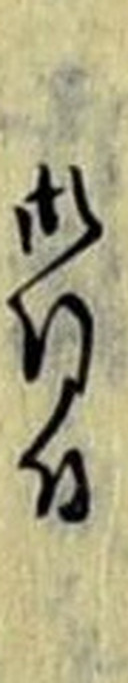御目付
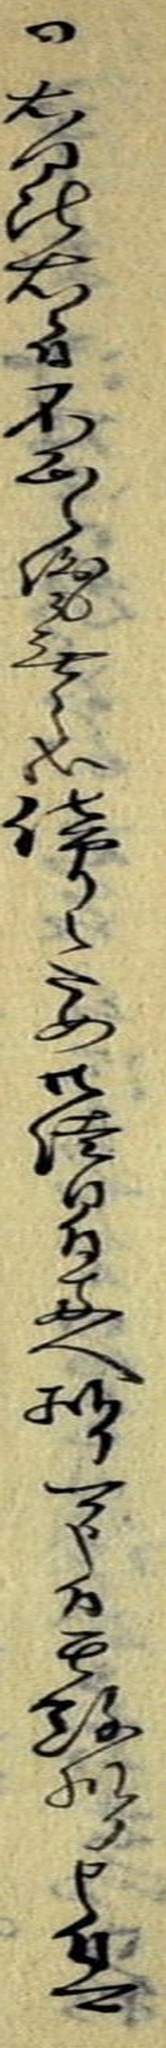○右同断右ニ付不正之儀も無之哉締り候ため御徒目付両人掛り可申付其余掛り申付可
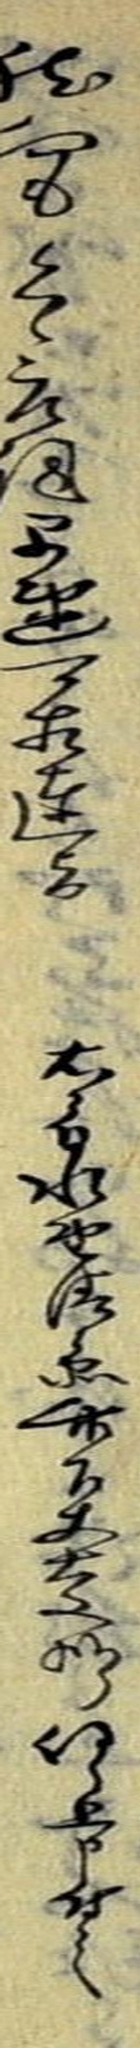然向も候ハヽ取調早速可相達旨右ニ付水野清兵衛竹下丈左衛門掛り任候上申付之
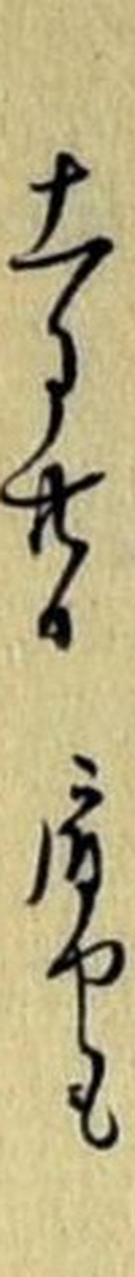十一月廿日府中へも
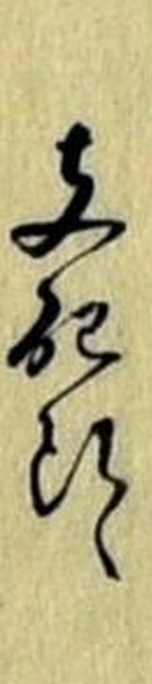支配頭へ
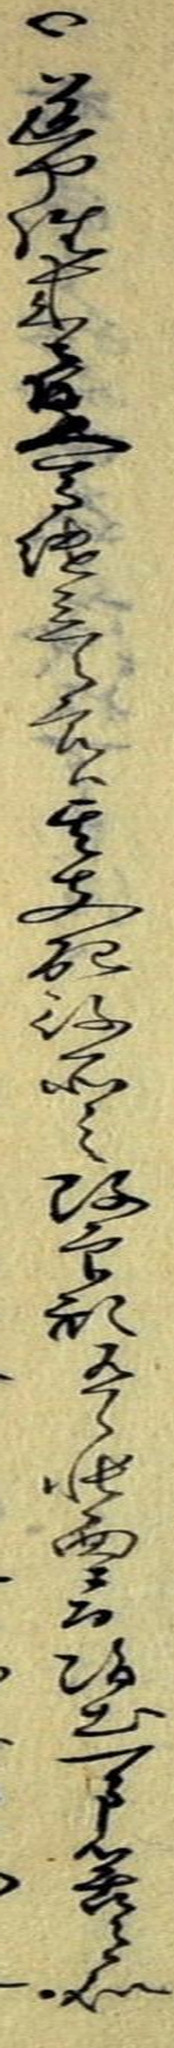○道中往来ニ付人馬継立之節ハ其支配致所之改印形有之帳面ニ而附出可申筈候処
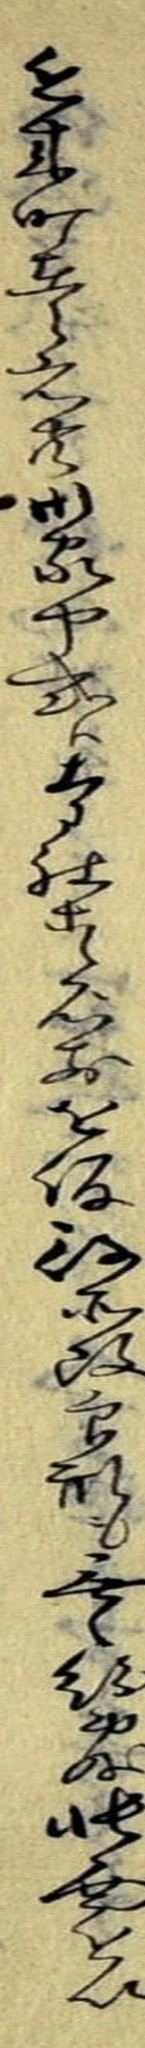近来町在之者共御家中或ハ寺社等之名前を仮役所改印形も無之紛敷帳面を以
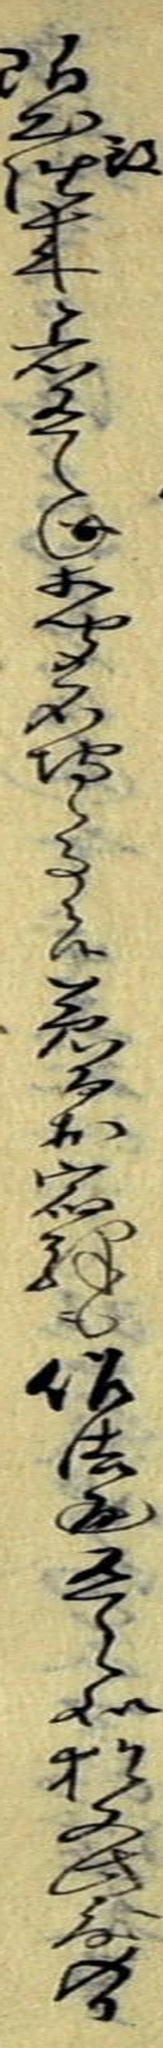附出致往来之者有之趣相聞不埒之事ニ候兼而於宿駅も作法通有之候処猶又此度〆り

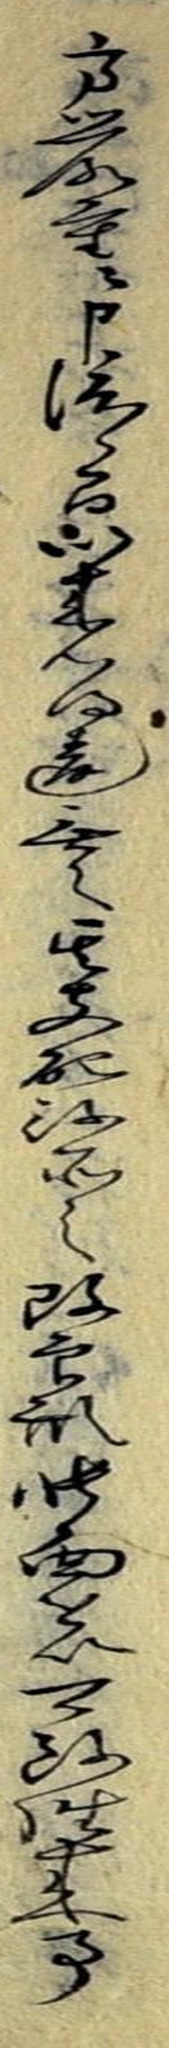方厳重ニ申渡候間以来心得違無之其支配役所之改印形帳面を以可致往来事
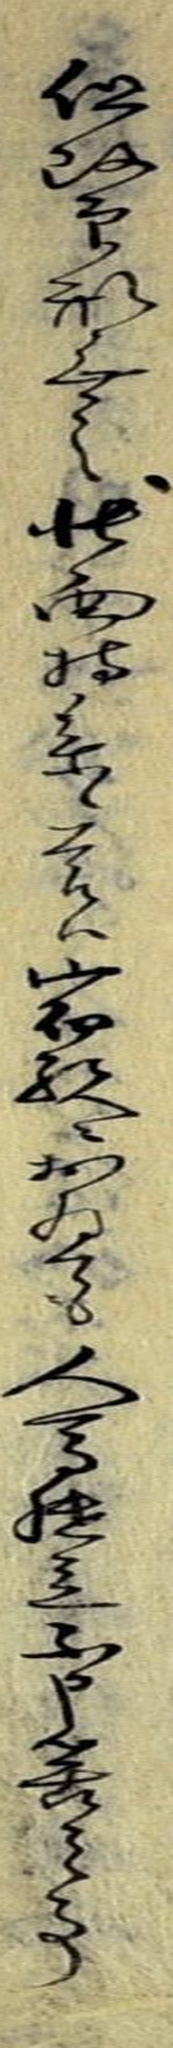但改印形無之帳面持参候節ハ宿駅ニおゐても人馬継立不申筈之事
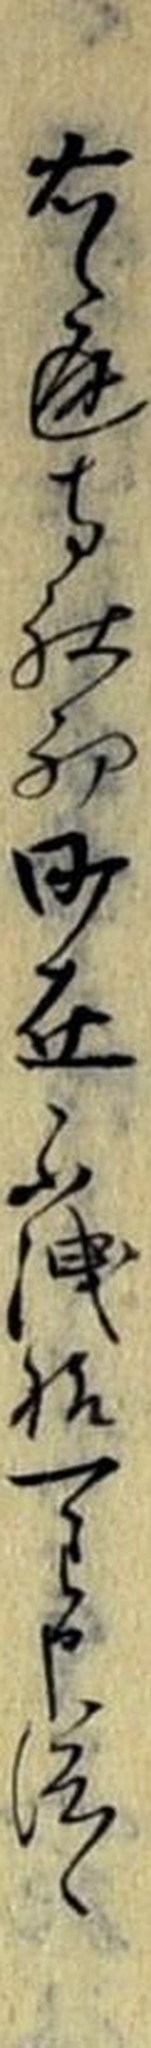右之通り寺社初町在不洩様可被申渡候
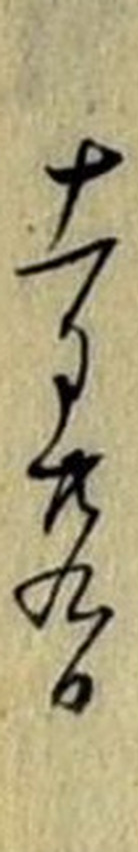十一月廿九日
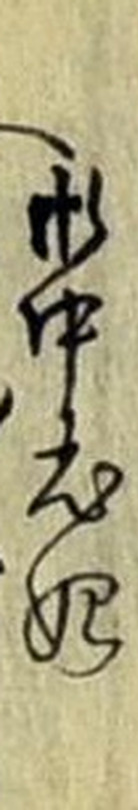御中老始
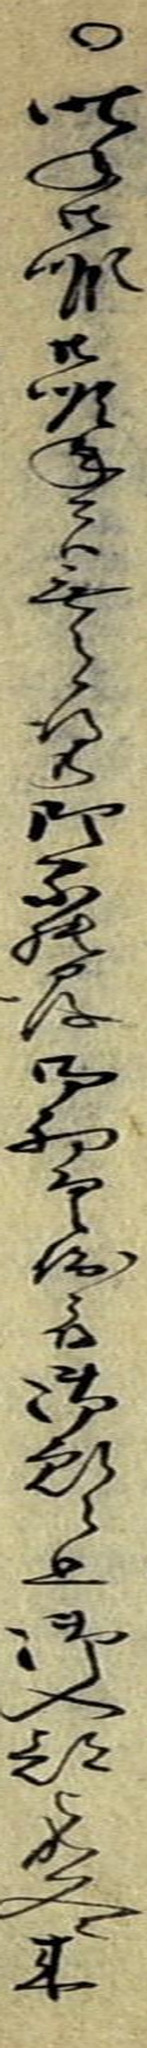○昨年御暇御順年ニハ無之候得共御家督後御初而之儀ニ付御願之上御入部被成又来
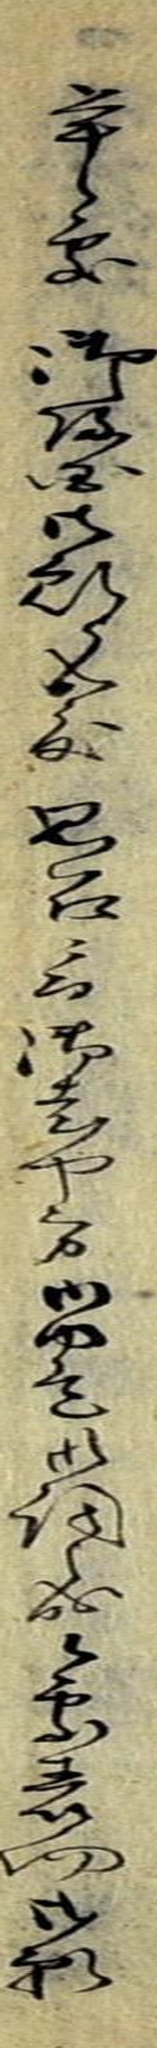年之処御帰国御願成度思召ニ而御老中方御内意御調之成候処表向御願
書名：命令之部 五
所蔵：福井県文書館 Fukui Prefectural Archives
